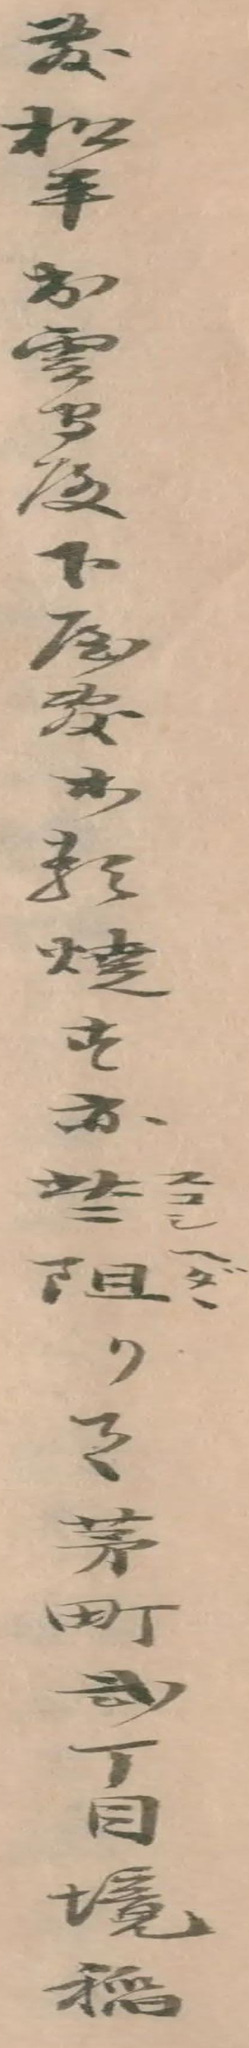敷松平出雲守殿下屋敷等類焼す亦些阻りて茅町弐丁目境稲
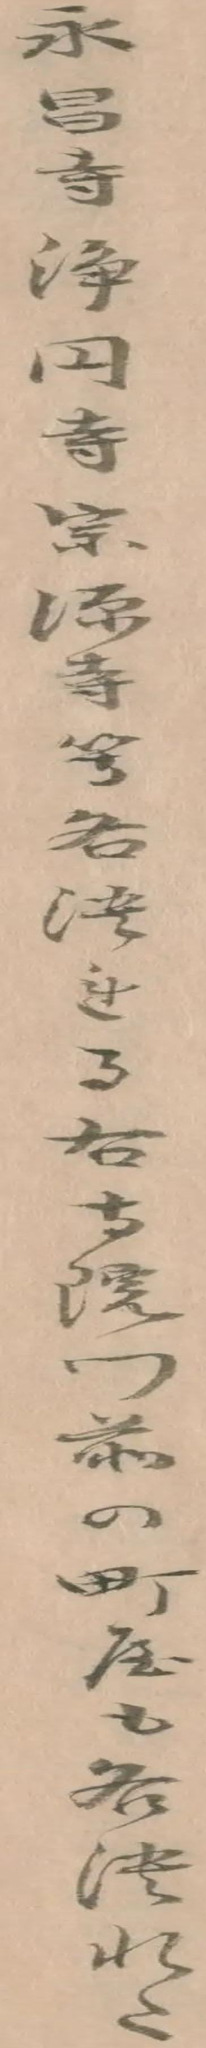永昌寺浄円寺宗源寺等各潰れる右寺院門前の町屋も各潰れた
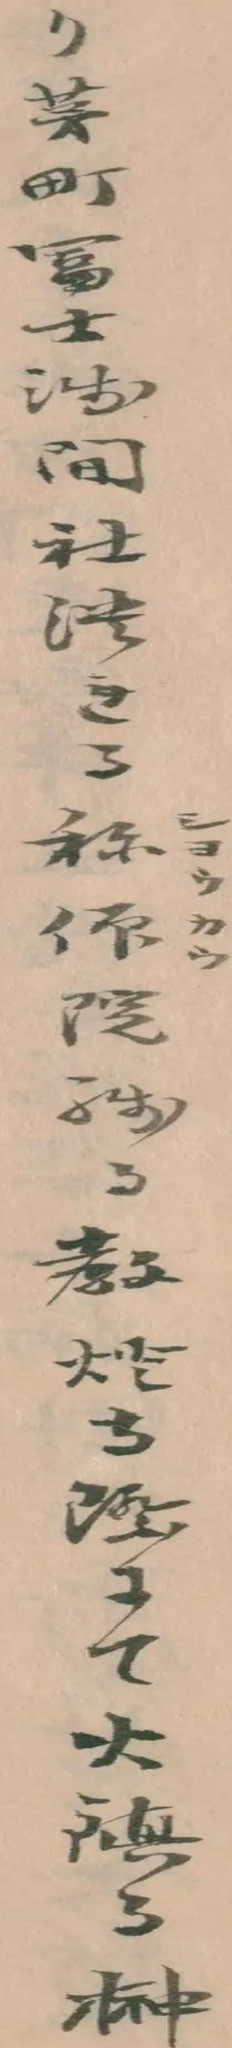り茅町富士浅間社潰れる称仰院残る教燈寺際にて火鎮る榊
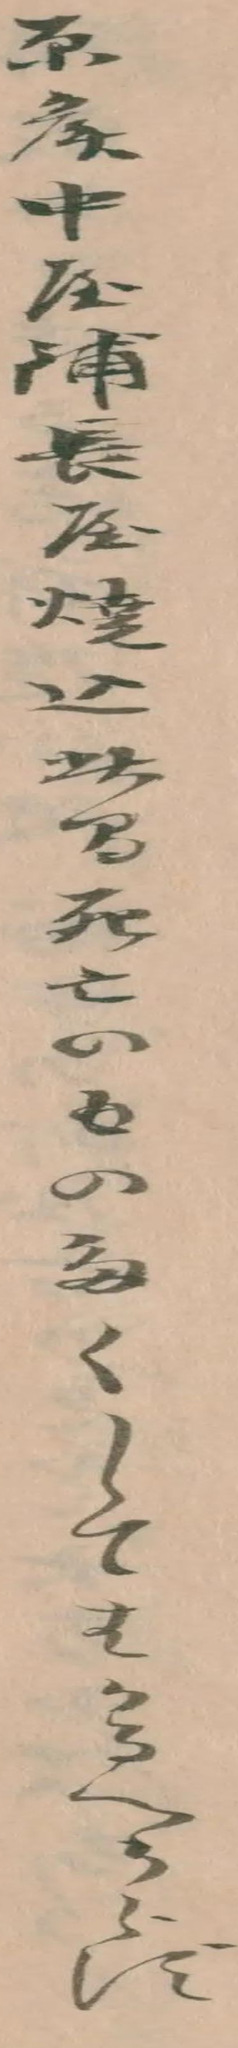原侯中屋鋪長屋焼込此間死亡のもの多くしてはかるへからす
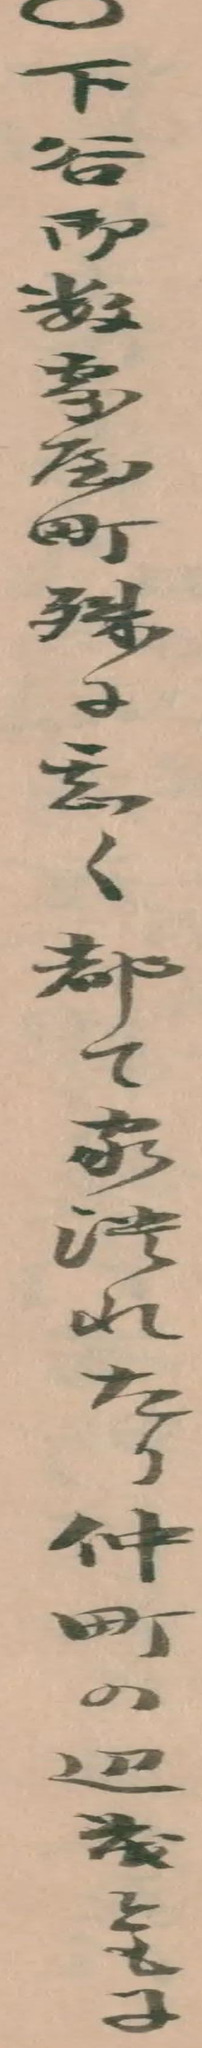○下谷御数寄屋町殊に甚く都て家潰れたり仲町の辺もともに
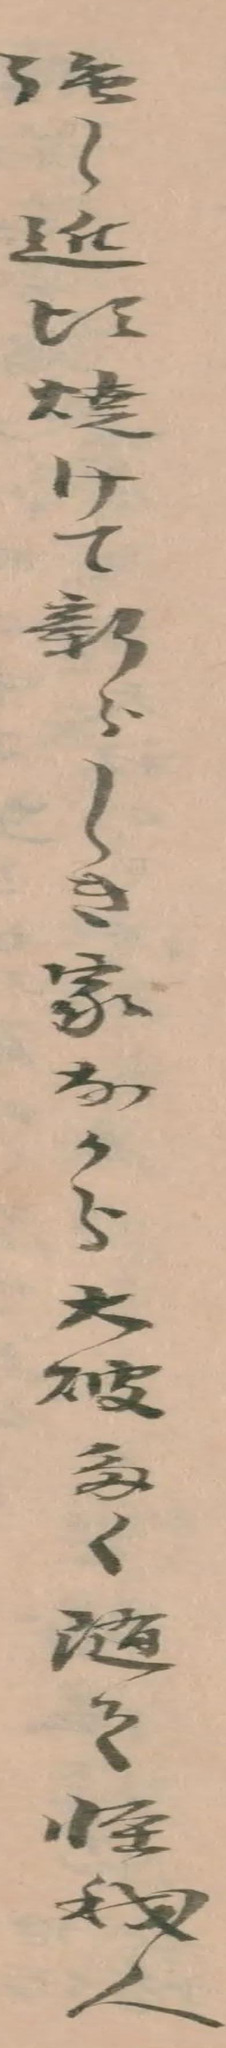強く近頃焼けて新らしき家なから大破多く随て怪我人
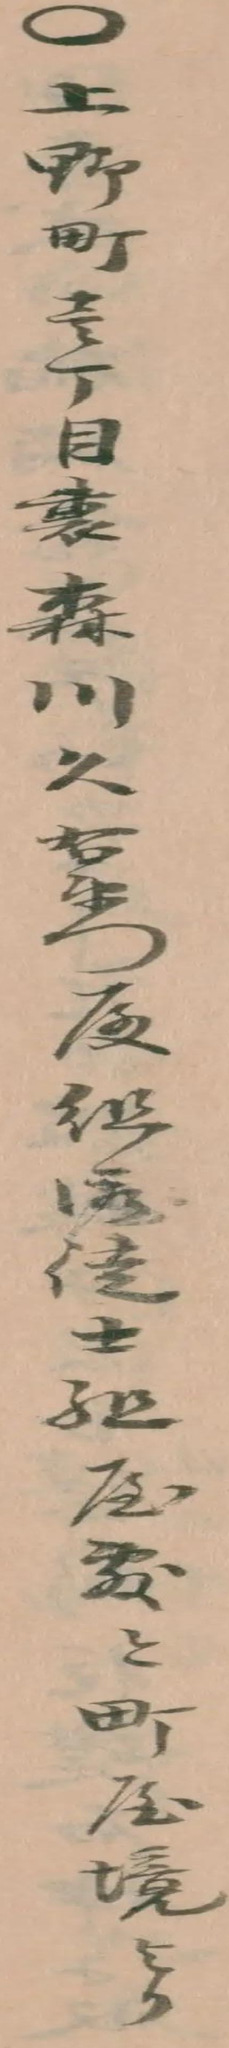○上野町壱丁目裏森川久右衛門殿組御歩士組屋敷と町屋境より
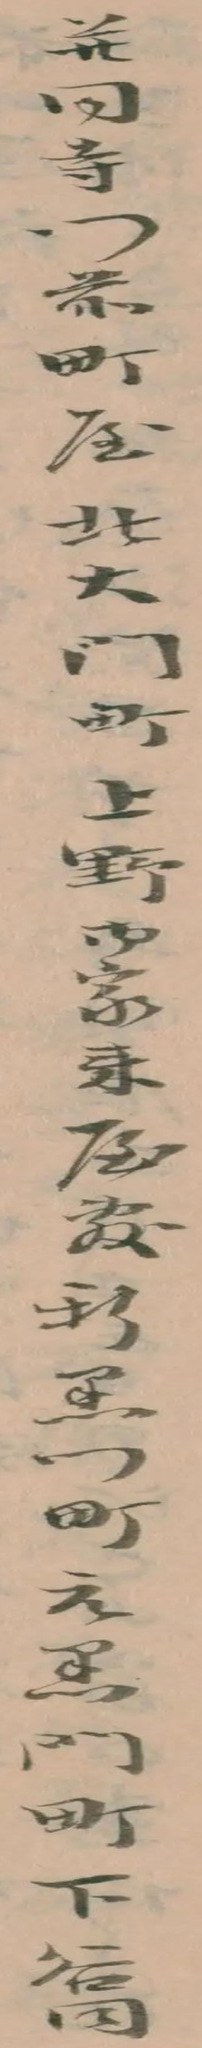并同寺門前町屋北大門町上野御家来屋敷新黒門町元黒門町下谷同
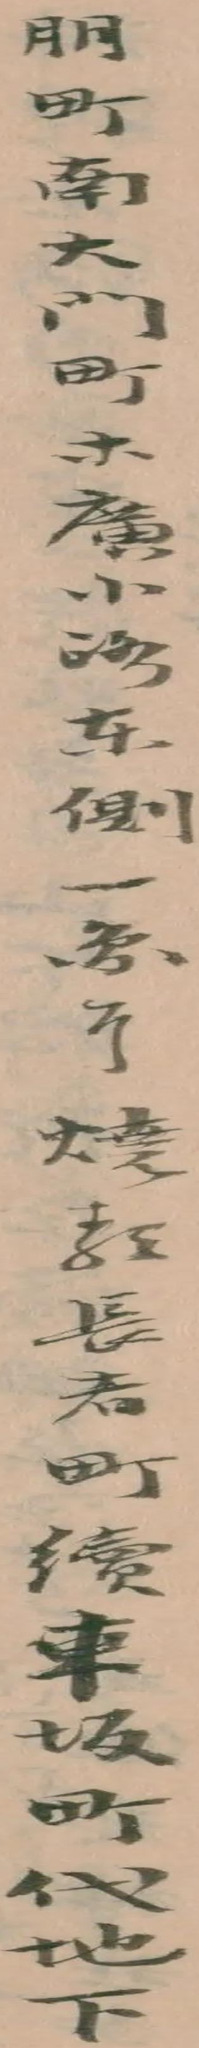朋町南大門町等広小路東側一円に焼る長者町続車坂町代地下
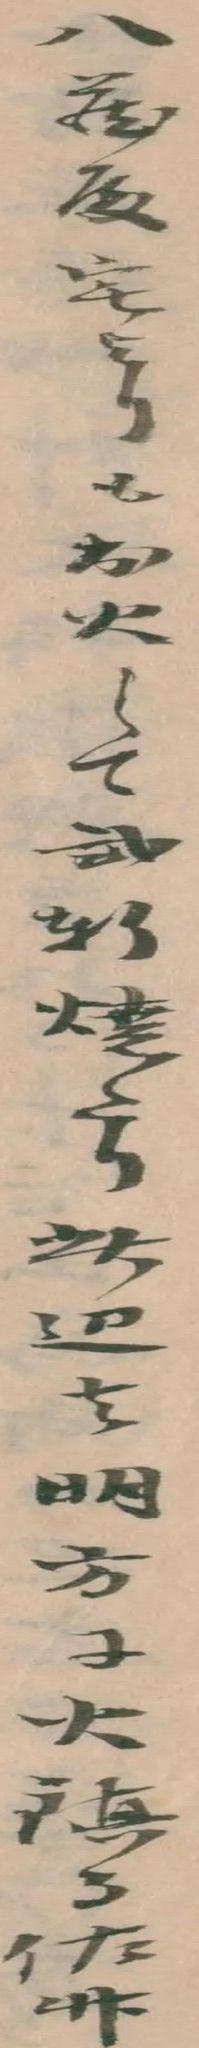八蔵殿宅よりも出火して弐軒焼たり此辺は明方に火鎮る佐竹
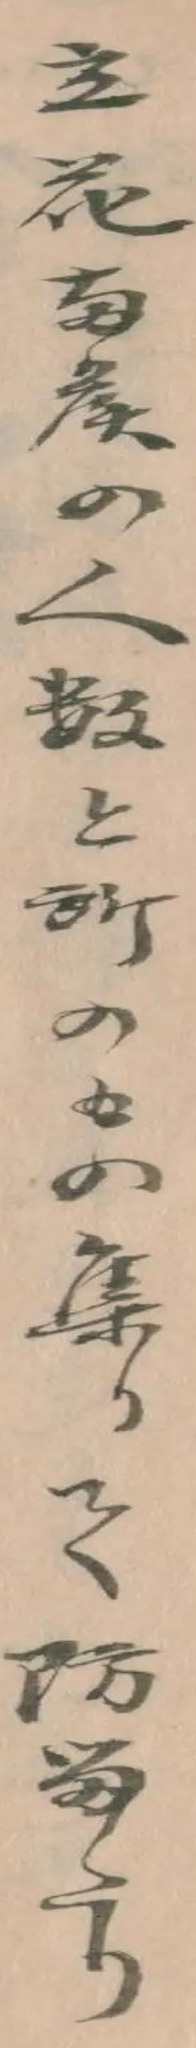立花両侯の人数と所のもの集りて防留たり

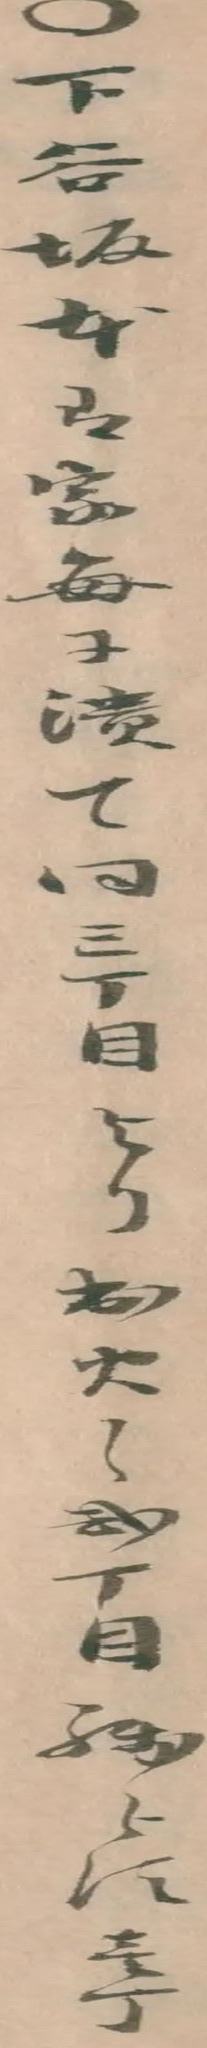〇下谷坂本は家毎に潰て同三丁目より出火し弐丁目残らす壱丁
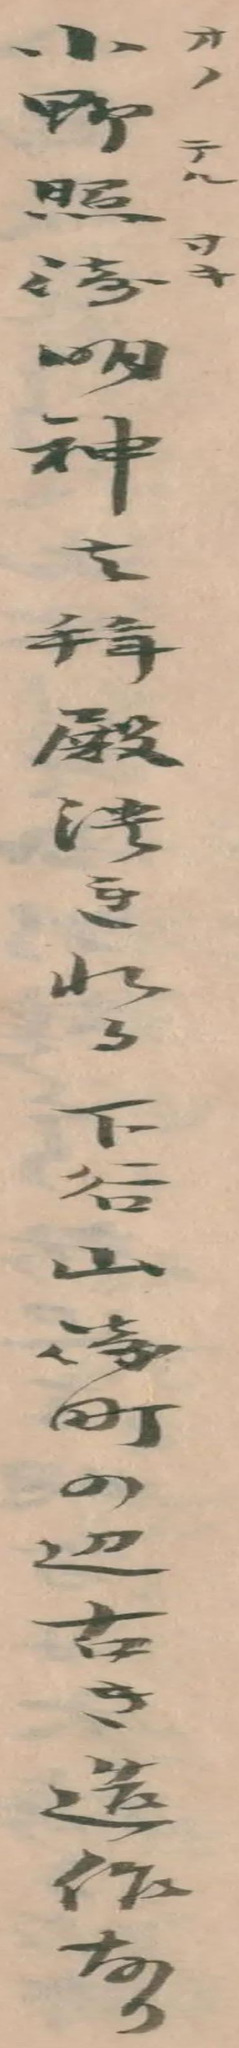小野照崎明神は拝殿潰れれる下谷山崎町の辺古き造作なり
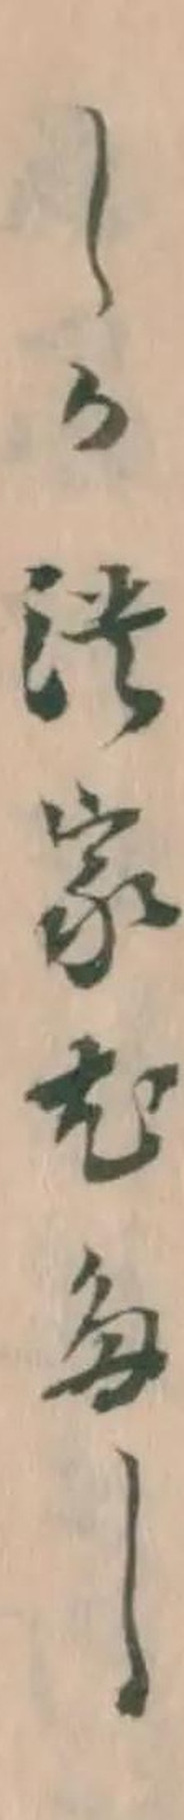しか潰家尤多し
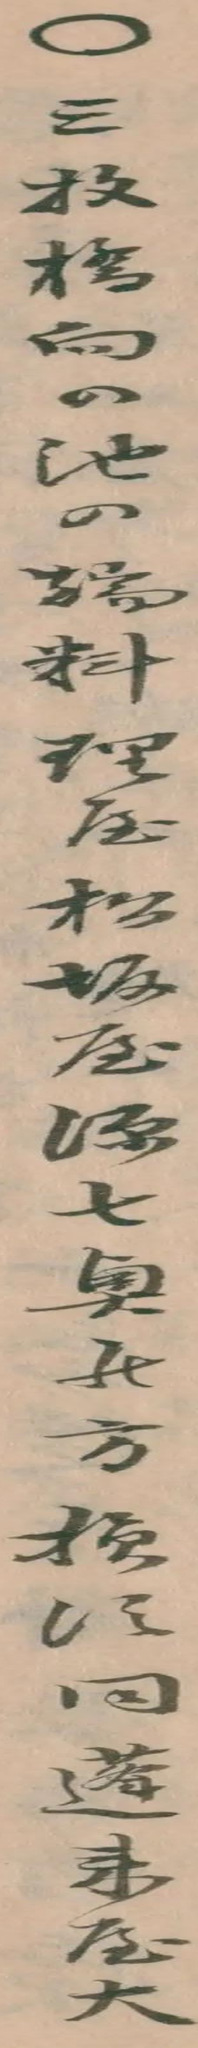〇三枚橋向の池之端料理屋松坂屋源七奥の方損す同蓬莱屋大
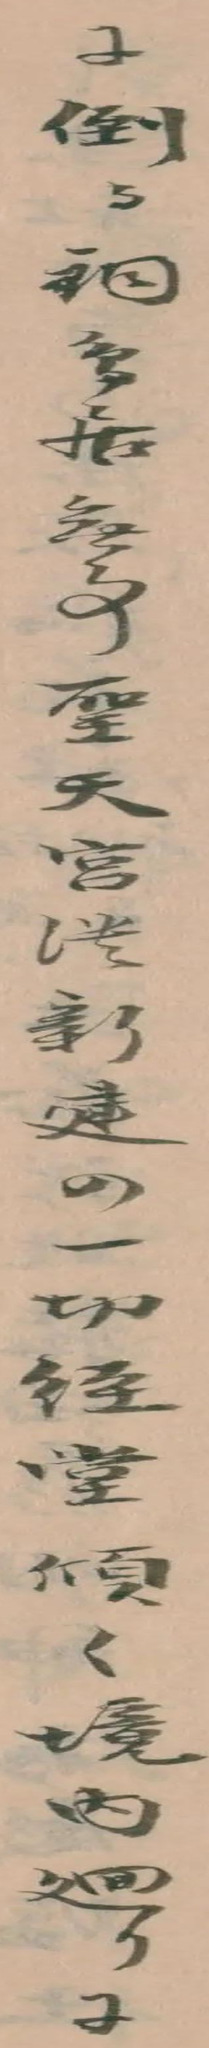に倒る銅鳥居無事聖天宮潰新建の一切経堂傾く境内廻りに
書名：地災撮要. 巻7-9(地震之部)
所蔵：国立国会図書館 National Diet Library, JAPAN
